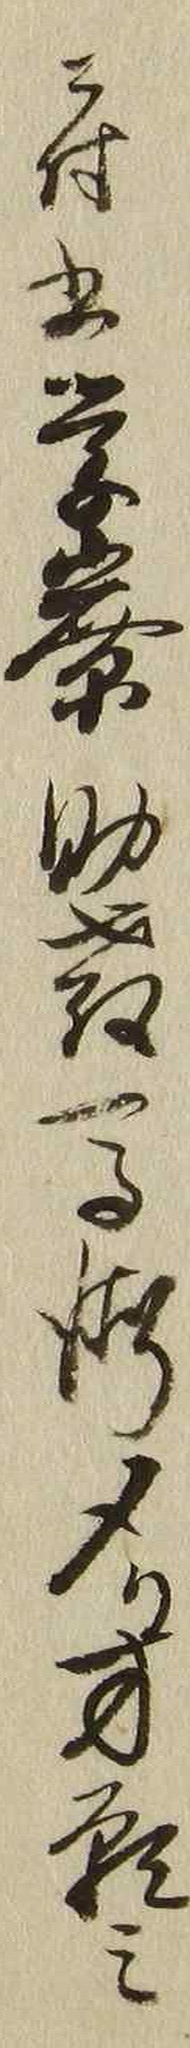ニ付書学寮助教馬術〆り方願之
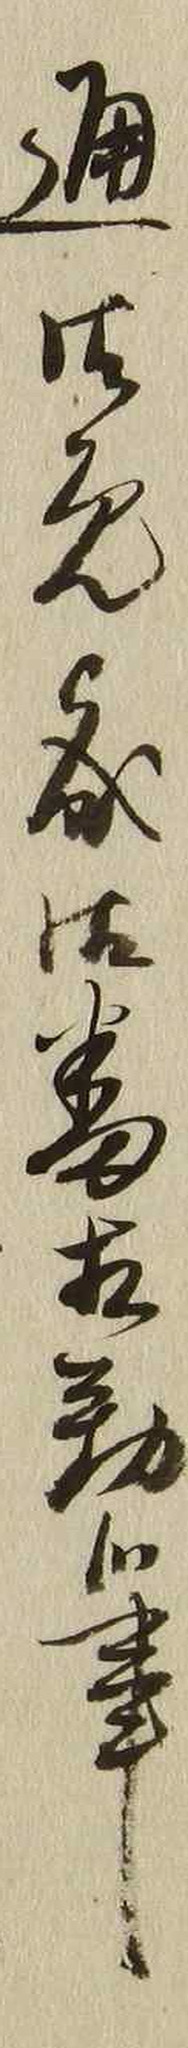通御免被成御番相勤候事
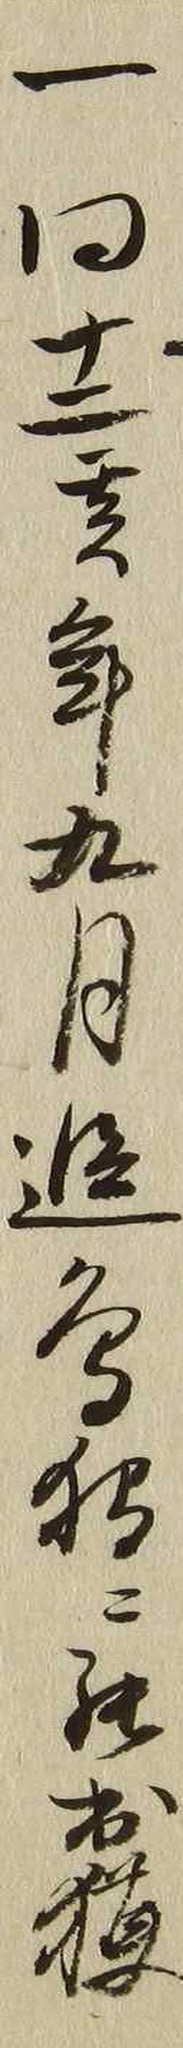一同十二亥年九月追鳥狩ニ罷出獲
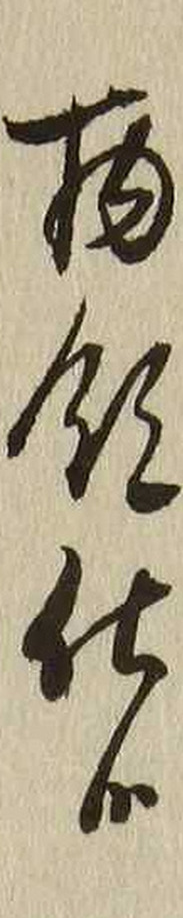拝領仕候
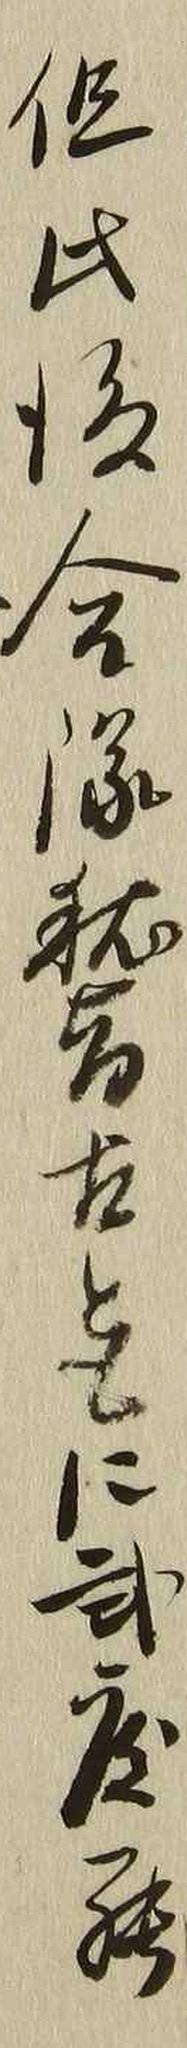但此後合隊稽古ともに弐度罷
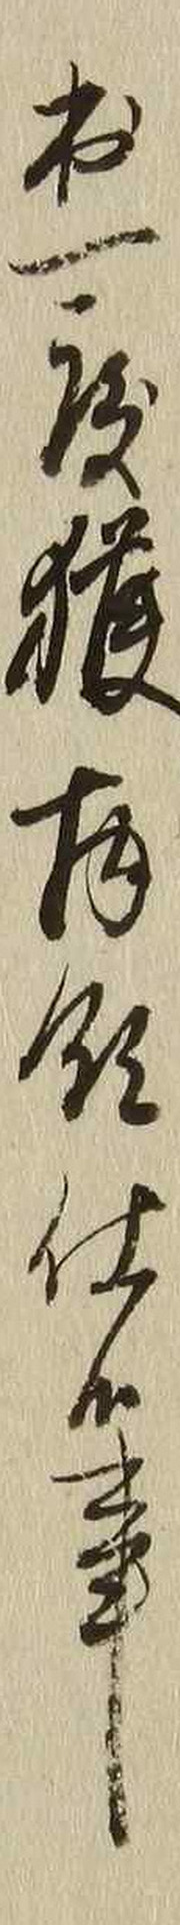出一度獲拝領仕候事
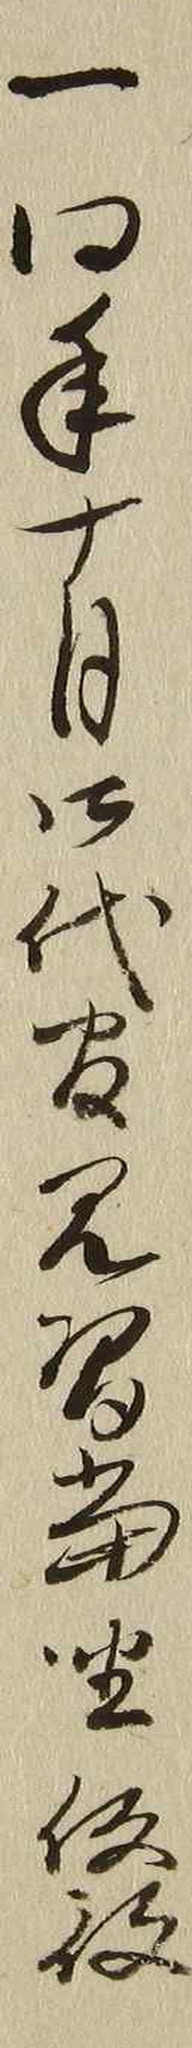一同年十月御代官見習当坐仮役
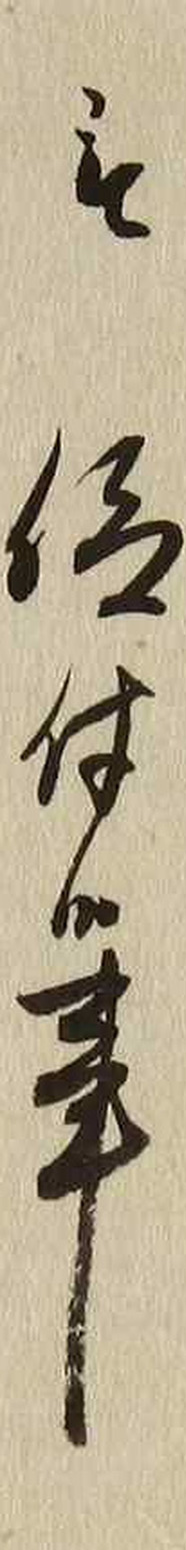被仰付候事
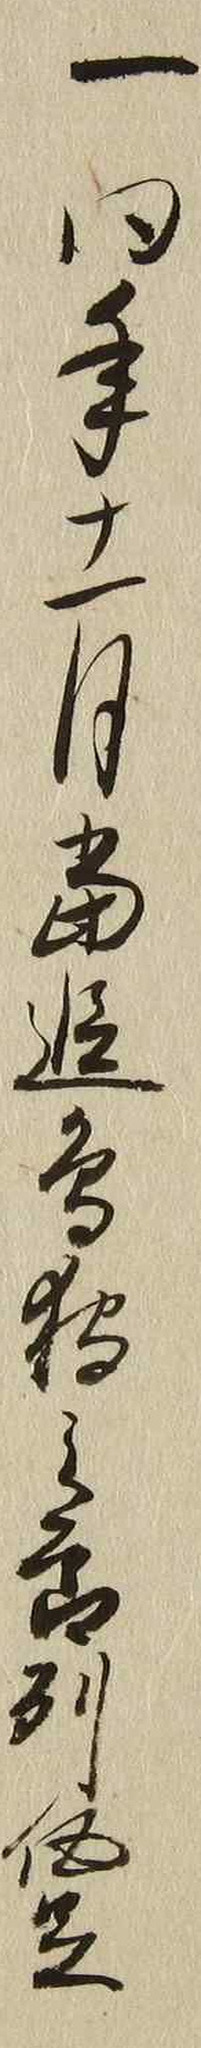一同年十一月当追鳥狩之節列伍足
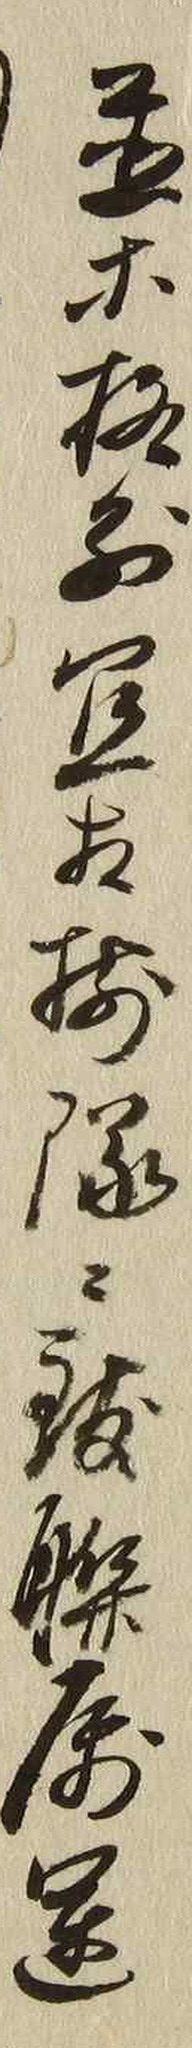並等格別宜相揃隊々致聯属運
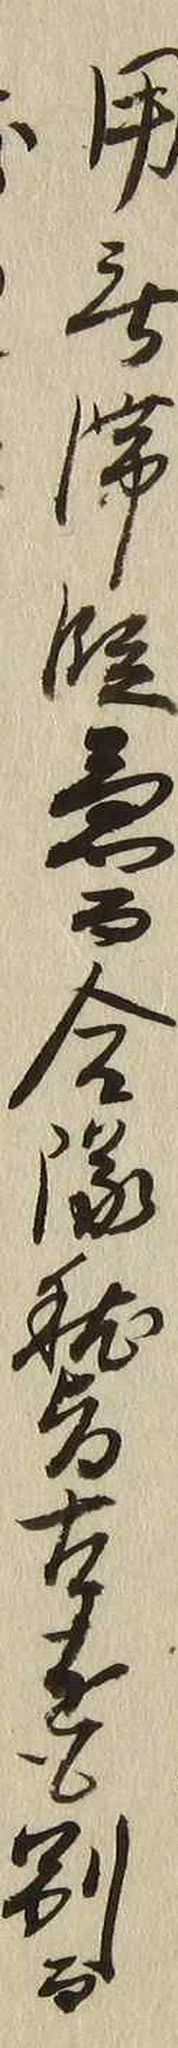用無滞段兼而合隊稽古をも別而
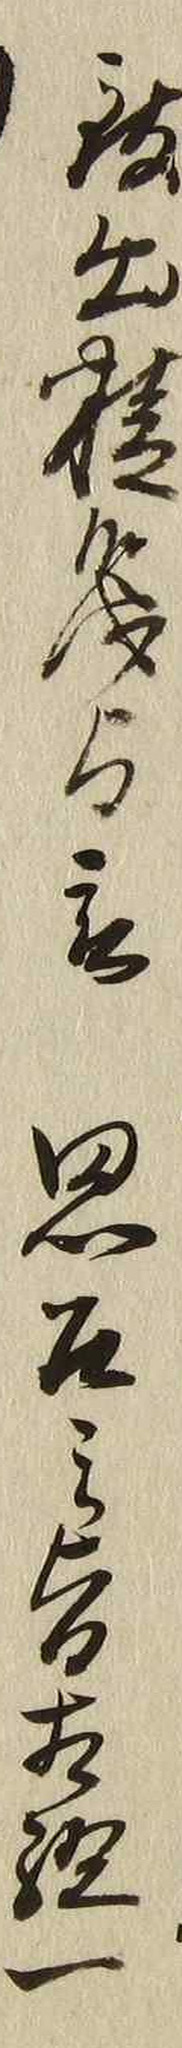致出精候儀与被思召之旨相組一
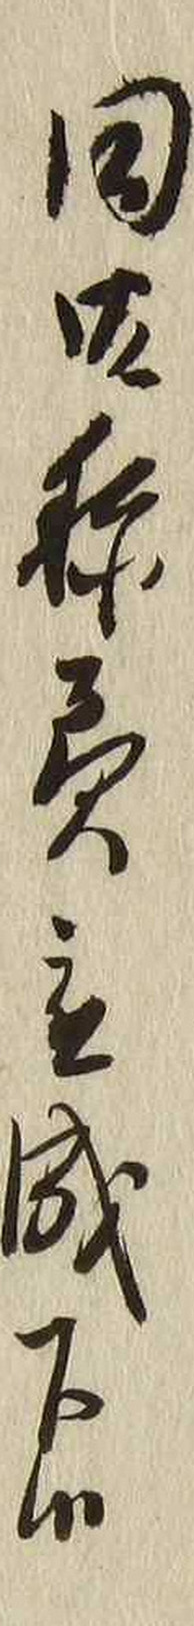同御称美被成下候
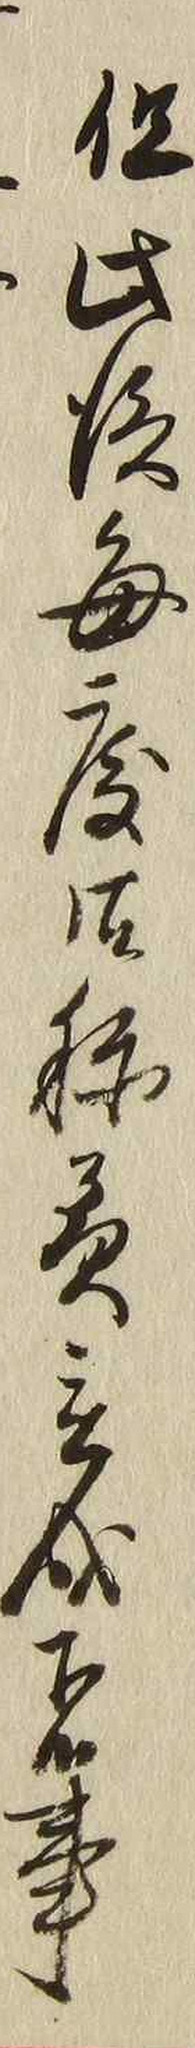但此後毎度御称美被成下候事
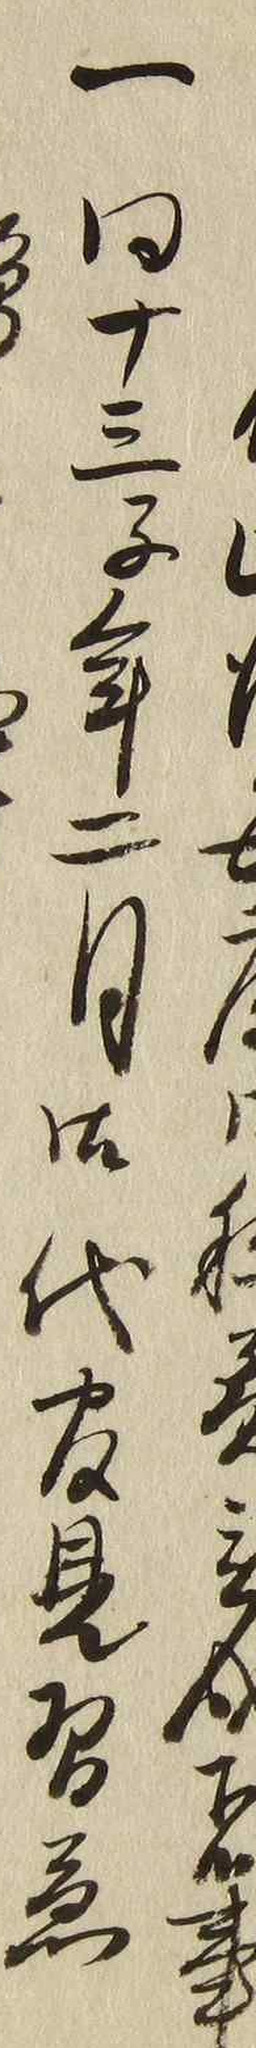一同十三子年二月御代官見習兼
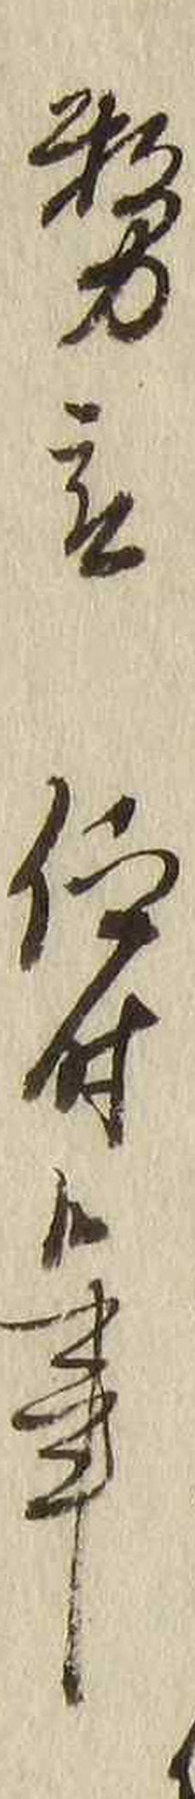務被仰付候事
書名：諸士系譜　巻之348　も之部4
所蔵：会津若松市立会津図書館
